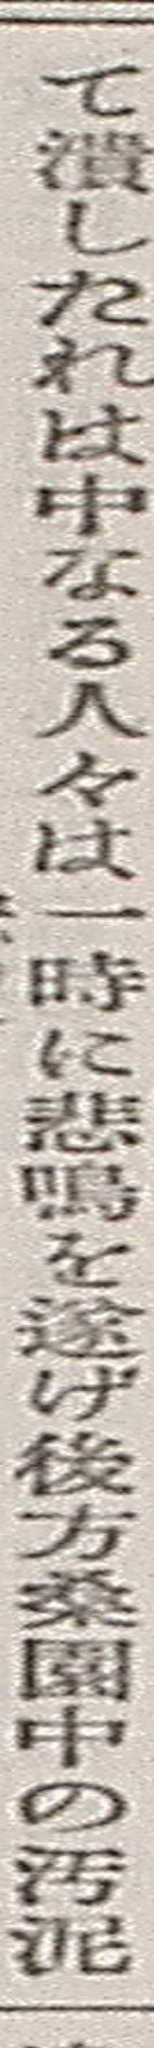て潰したればは中なる人々は一時に悲鳴を遂げ後方桑園中の汚泥
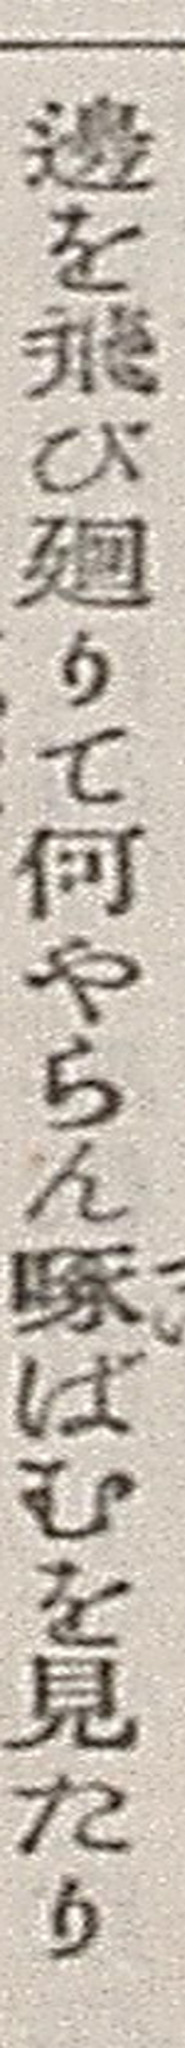辺を飛び廻りて何やらん啄ばむお見たり
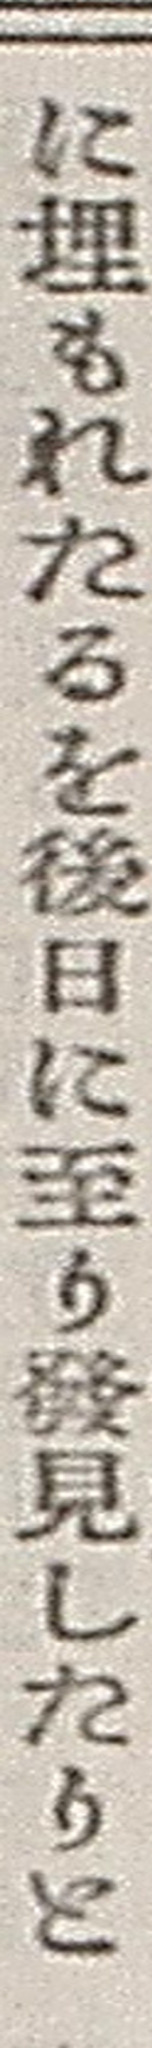に埋もれたるを後日に至り発見したりと
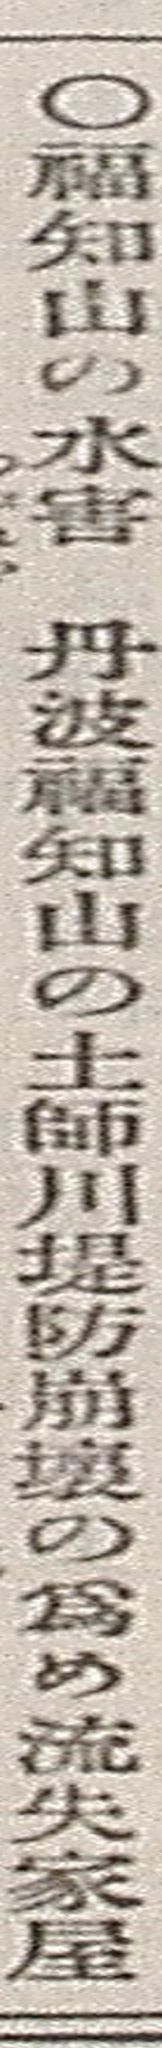◯福知山の水害丹波福知山の土師川堤防崩壊の為め流失家屋
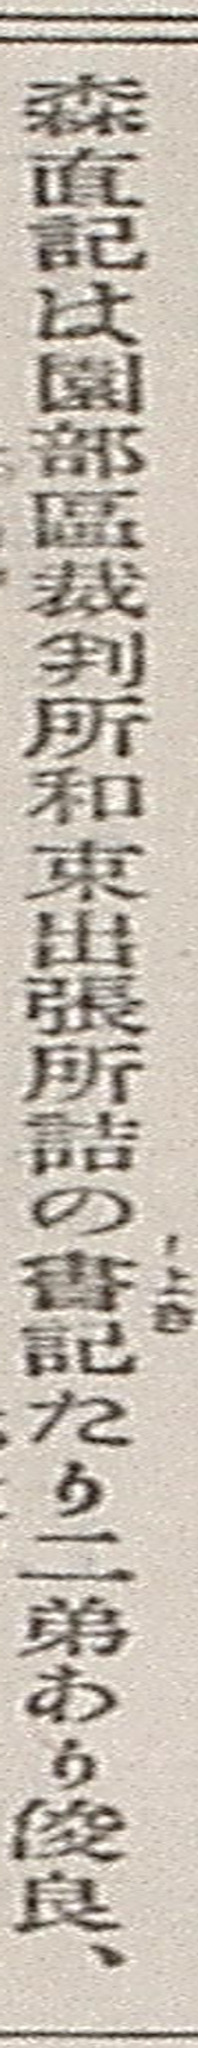森直紀は園部區裁判所和束出張所詰の書記たり二弟あり俊良、
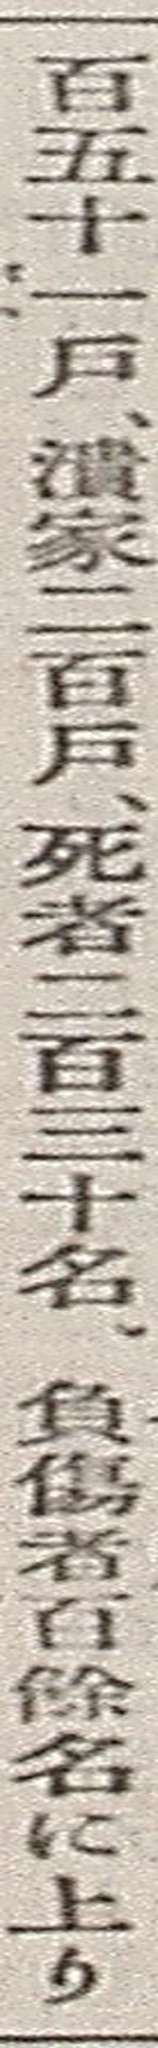百五十一戸、潰家二百戸、死者二百三十名、負傷者百餘名に上り
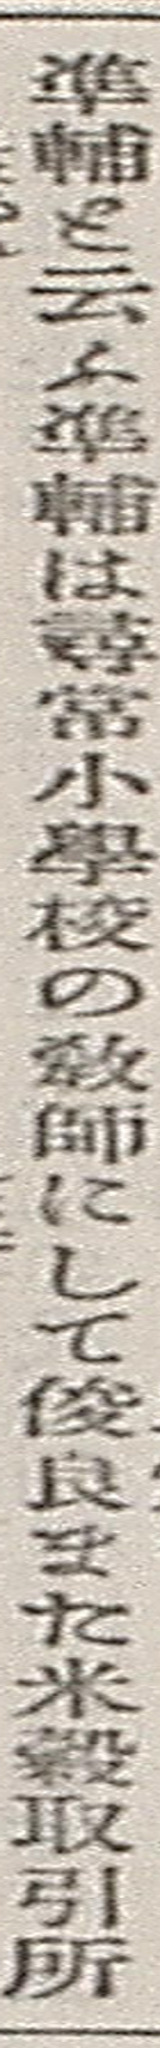準輔と云ふ準輔は尋常小学校の教師にして俊良また米穀取引所
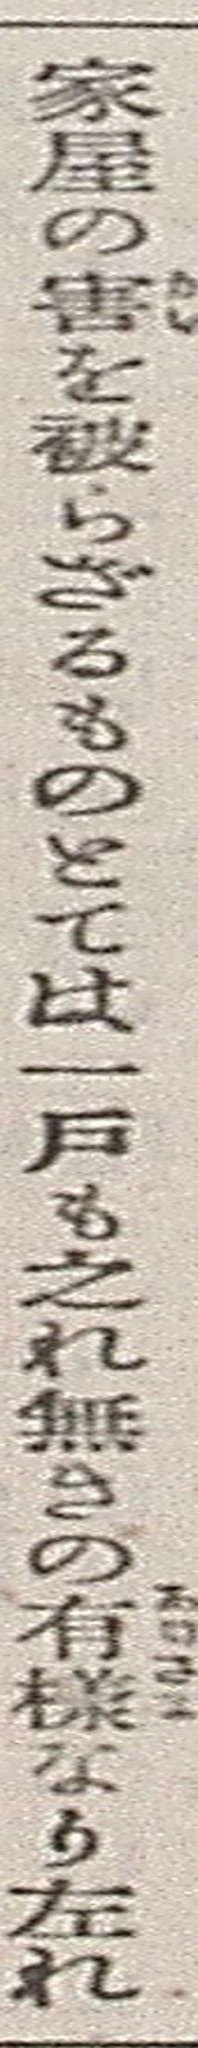家屋の害を被らざるものとては一戸も之れ無きの有様なり左れ
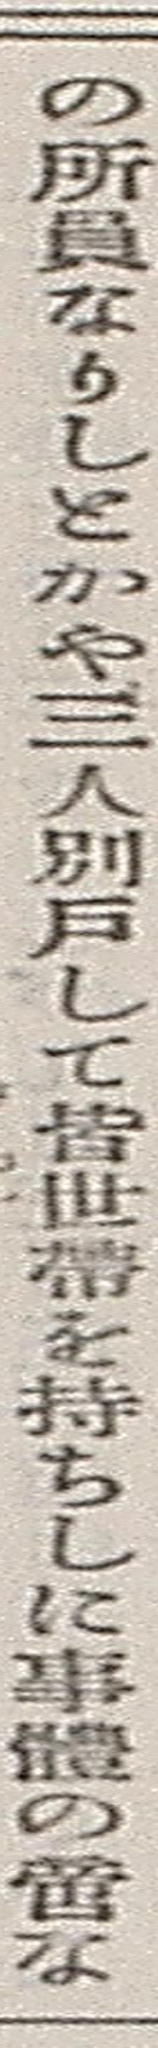の所員なりしとかや三人別戸して皆世帯を持ちしに事体の啻な
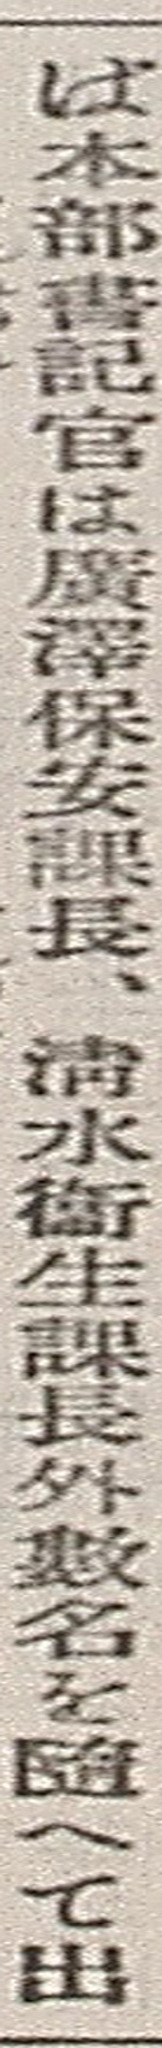ば本部書記官は広沢保安課長、清水衛生課長外数名を随ｈて出
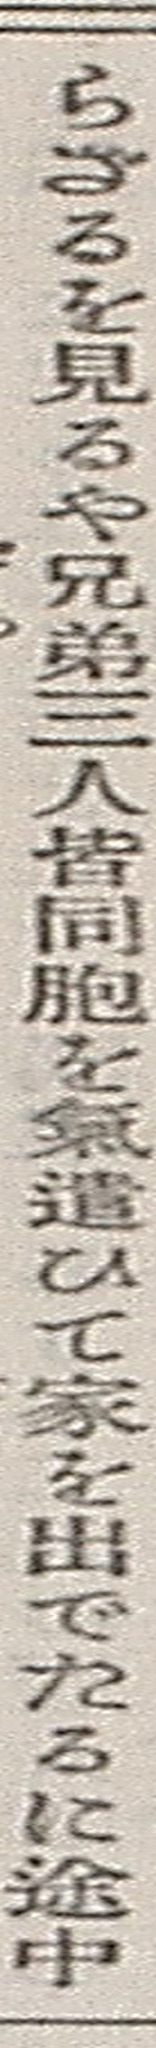らざるを見るや兄弟三人皆同胞を気遣ひて家を出でたるに途中
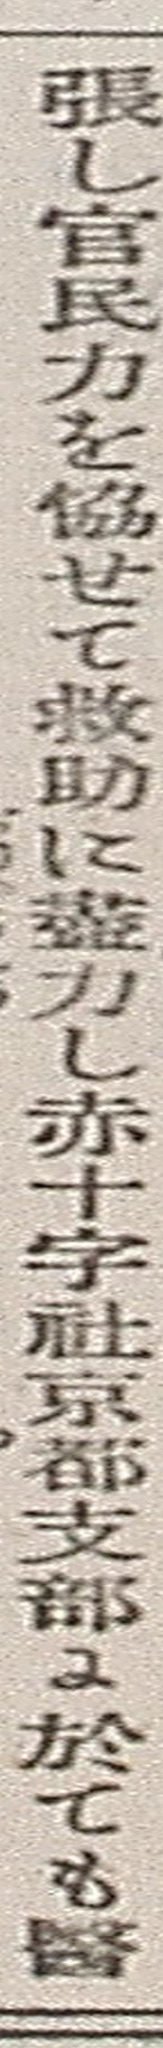張し官民力を協せて救助に尽力し赤十字社京都支部に於ても医
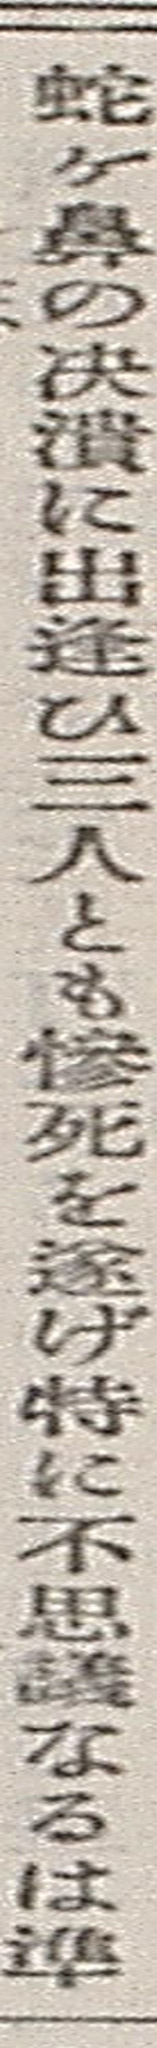蛇ヶ鼻の决潰に出逢ひ三人とも惨死を遂げ特に不思議なるは準
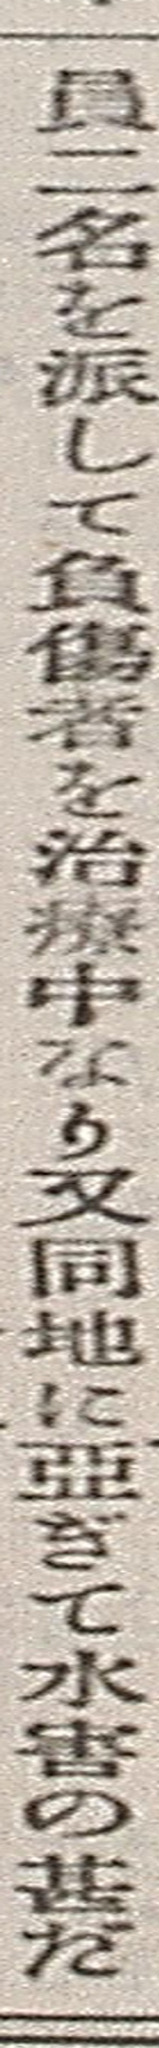員二名を派して負傷者を治療中なり又同地に亜ぎて水害の甚だ
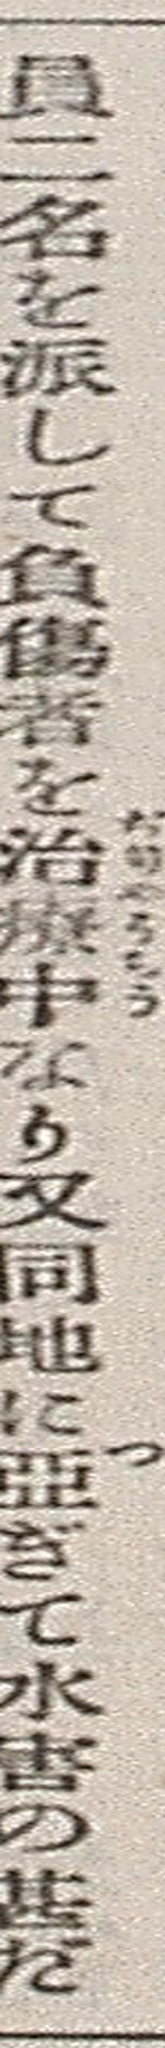員二名を派して負傷者を治療中なり又同地に亜ぎて水害の甚だ
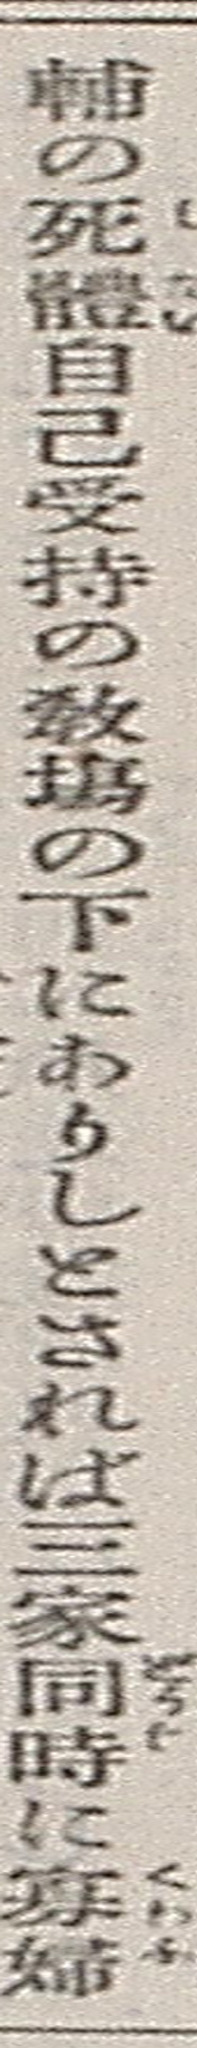輔の死体自己受持の教場の下にありしとされば三家同時に寡婦
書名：風俗畫報臨時増刊第百二十六號　洪水被害録（中）
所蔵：東京大学地震研究所図書室 Earthquake Research Institute Library, The University of Tokyo, JAPAN
